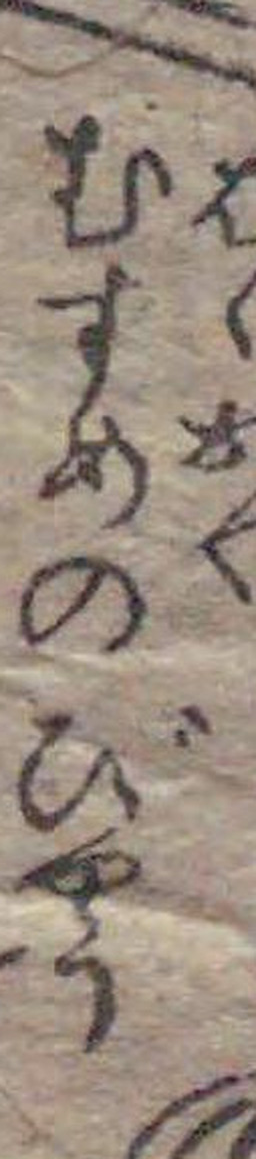むすめのびやう
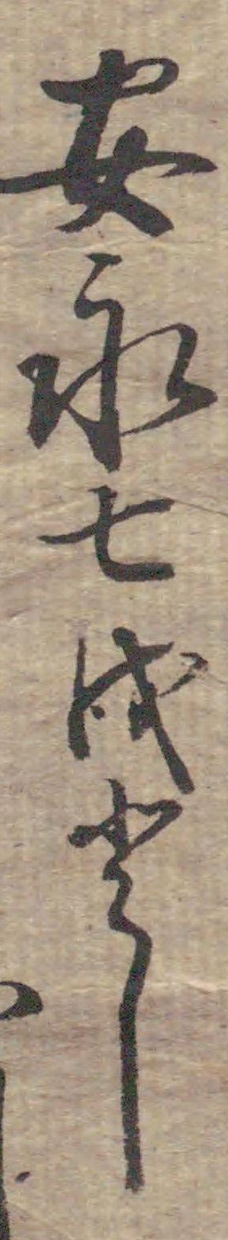安永七戌とし
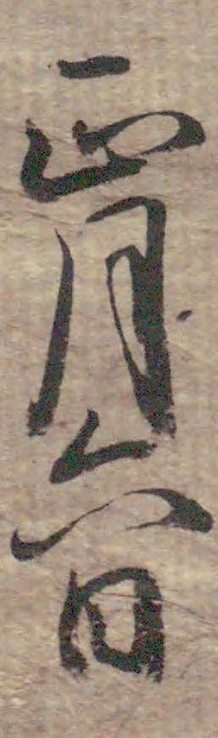正月六日
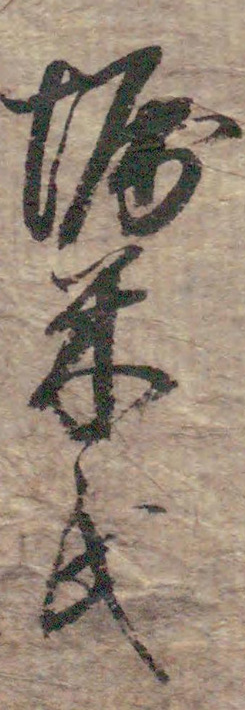堀米氏

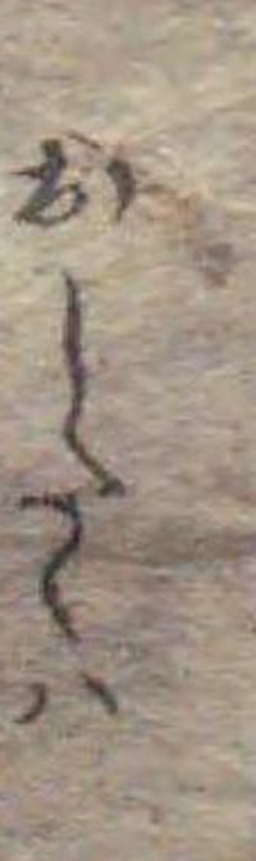おしたくは
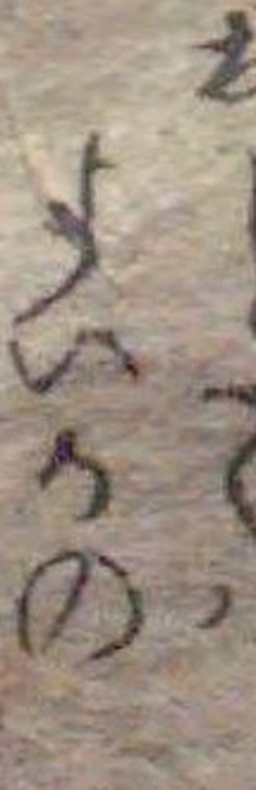よいかの
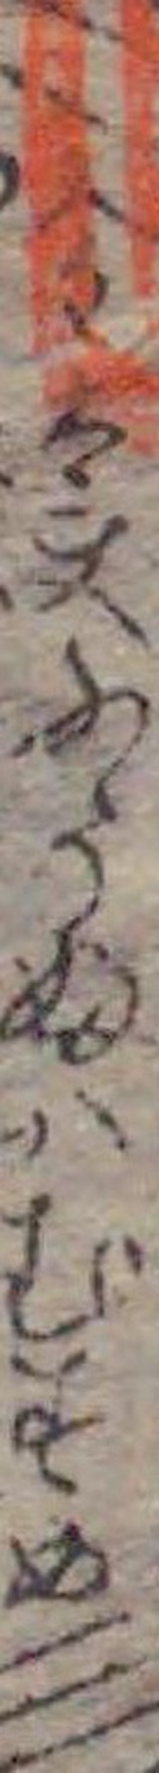金太夫ふうふはむすめ
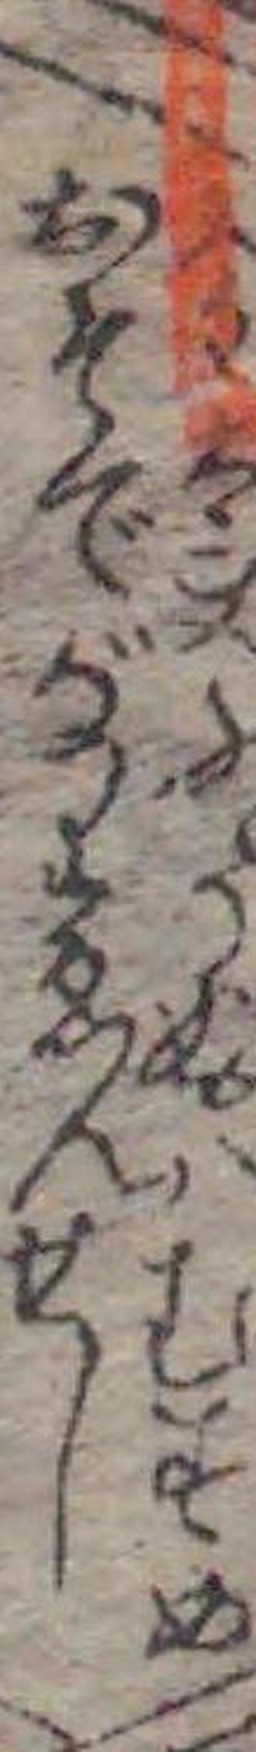おそでがりゑんせし
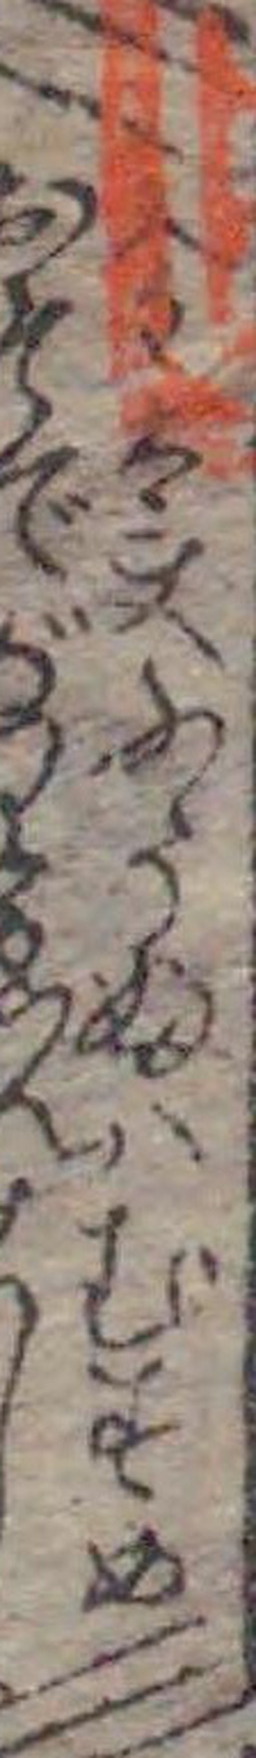おそでがりゑんせし
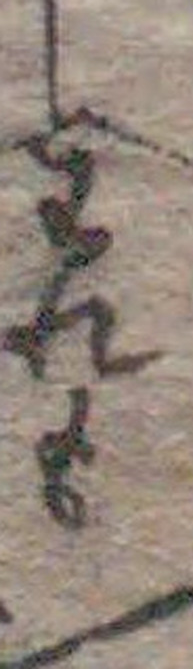われも
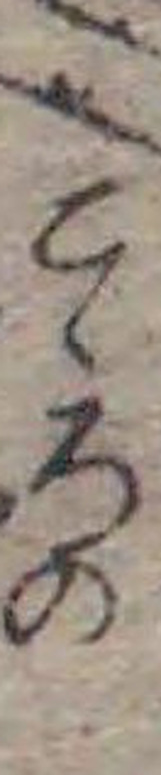こゝろの
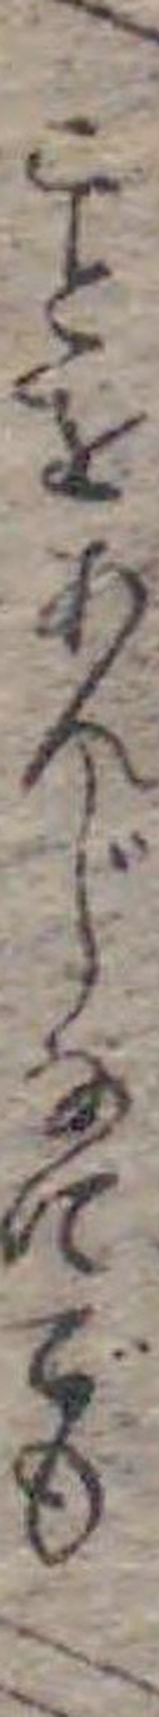ことをあんじなにでも
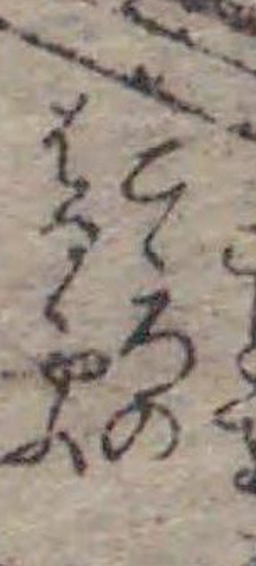はるゝやふ
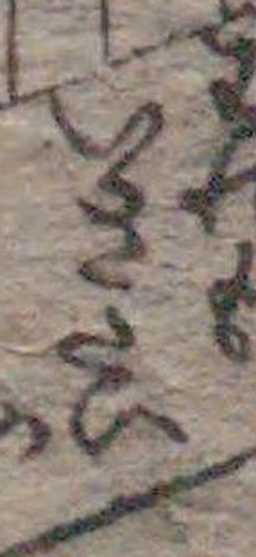いきたい
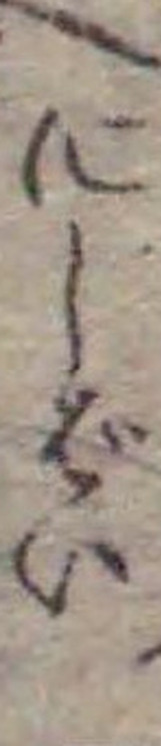にしばい
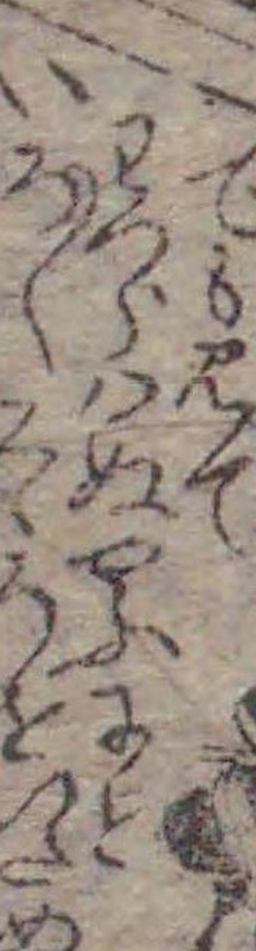わつらはぬやふにと
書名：神田与吉一代記 : 3巻
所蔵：国立国会図書館 National Diet Library, JAPAN
